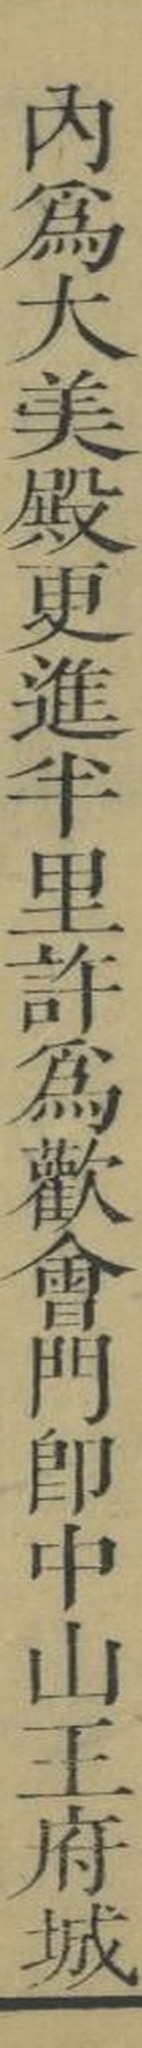内爲大美殿更進半里許爲歡會門卽中山王府城
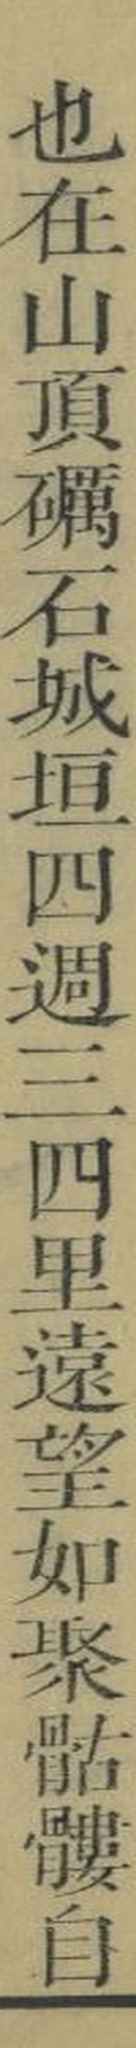也在山頂礪石城垣四週三四里遠望如聚骷髏自
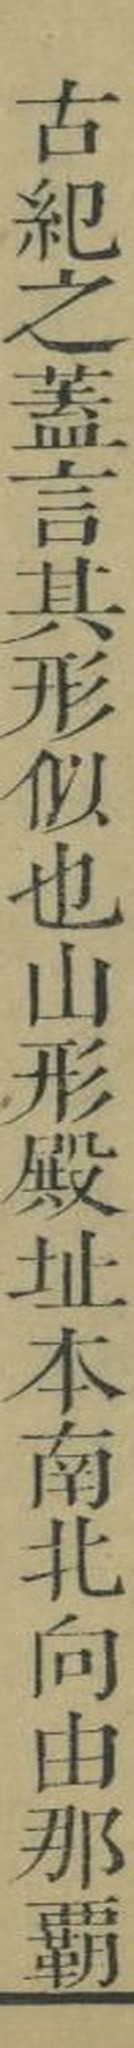古紀之蓋言其形似也山形殿址本南北向由那覇
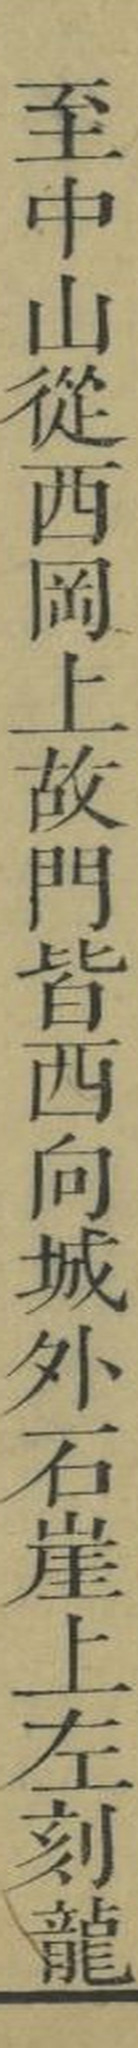至中山從西岡上故門皆西向城外石崖上左刻龍
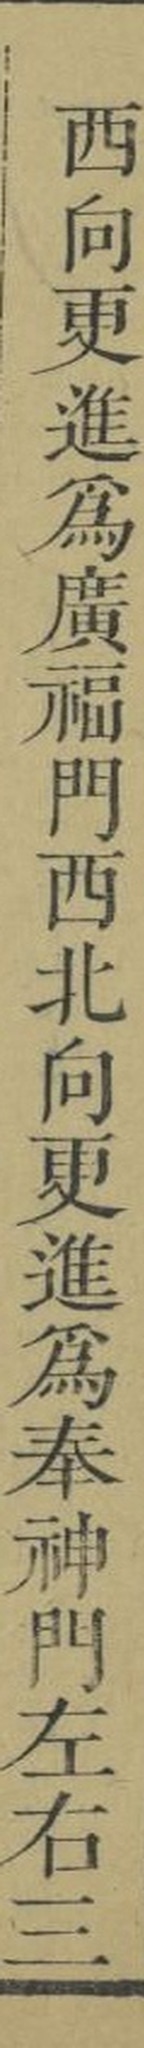西向更進爲廣福門西北向更進爲奉神門左右三
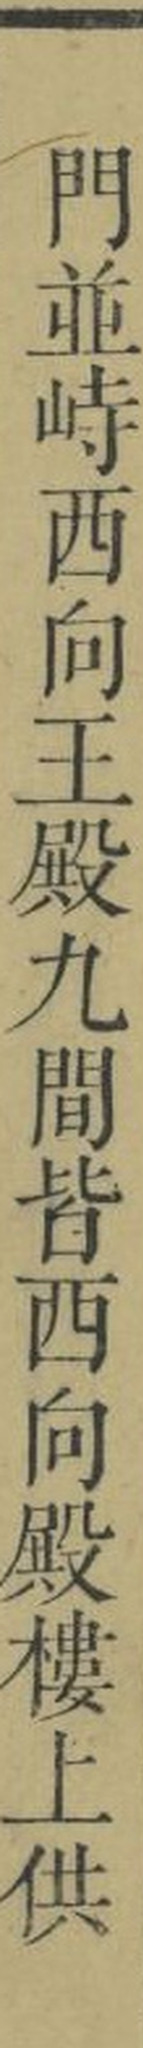門並峙西向王殿九間皆向殿樓上供
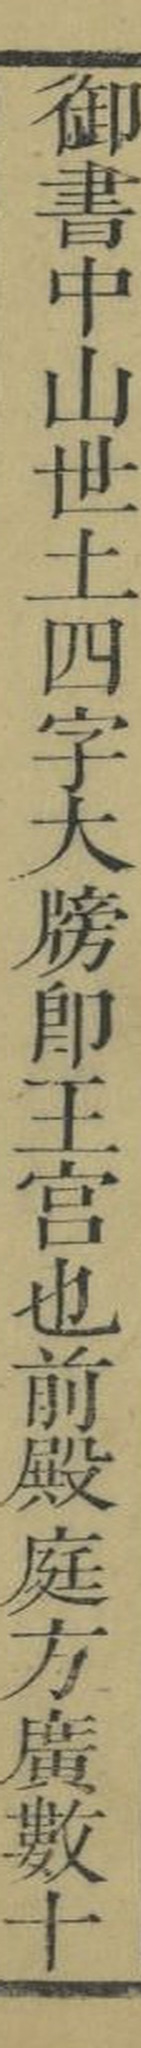御書中山世土四字大牓卽王宫也前殿庭方廣數十
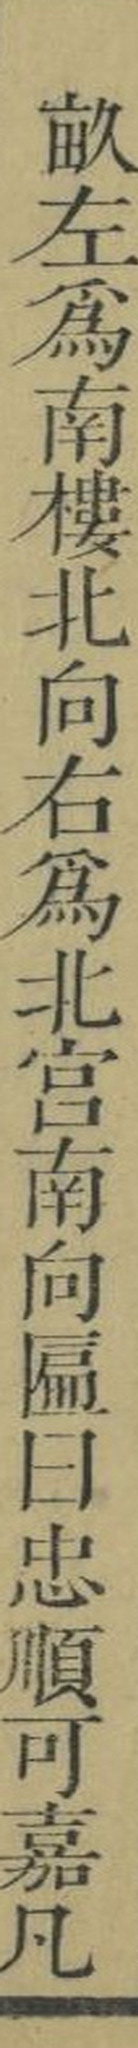畝左爲南樓北向右爲北宫南向匾曰忠順可嘉凡
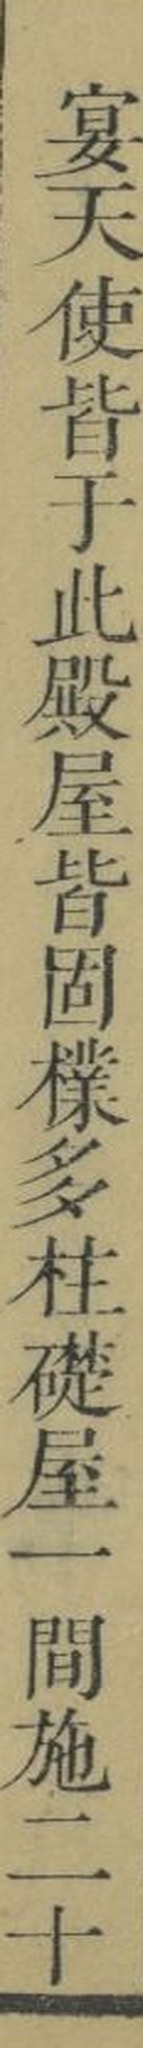宴天使皆于此殿屋皆固檏多柱礎屋一間施二十
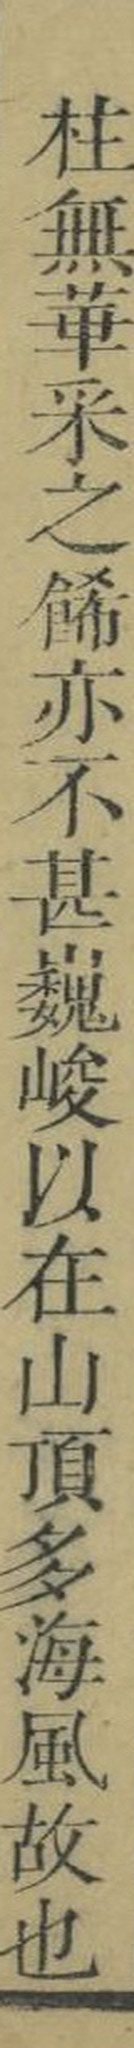柱無華采之餙亦不甚巍峻以在山頂多海風故也
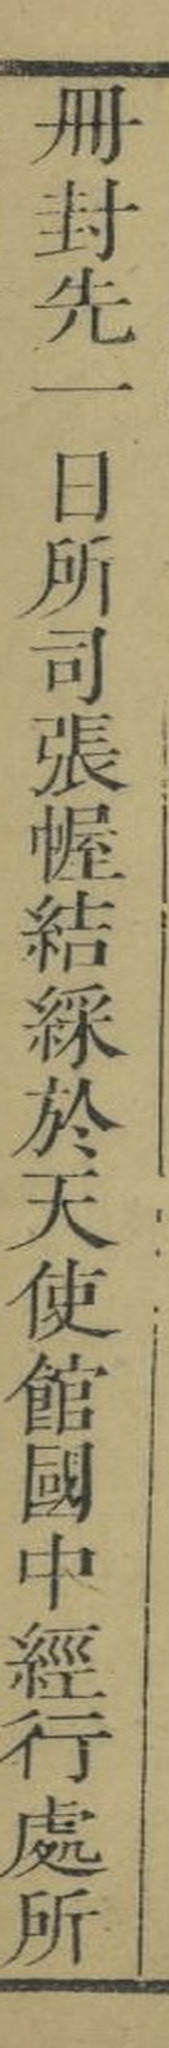冊封先一日所司張幄結綵於天使館國中經行處所

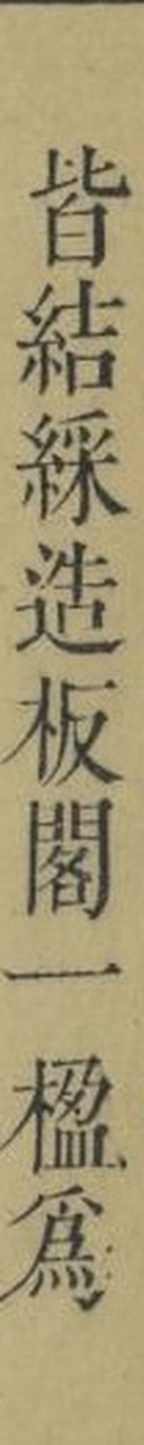皆結綵造板閣一楹爲
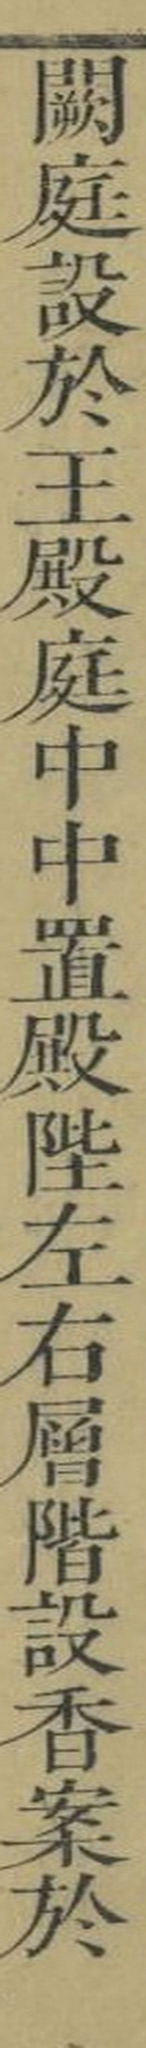闕庭設於王殿庭中中置殿陛左右層階設香案於
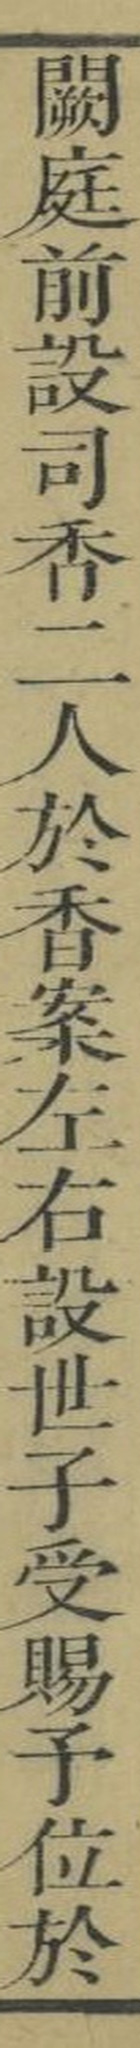闕庭前設司香二人於香案左右設世子受賜予位於
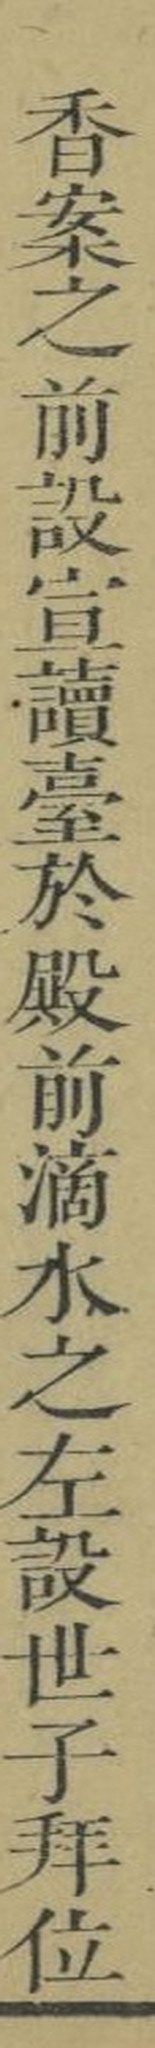香案之前設宣讀臺於殿前滴水之左設世子拜位
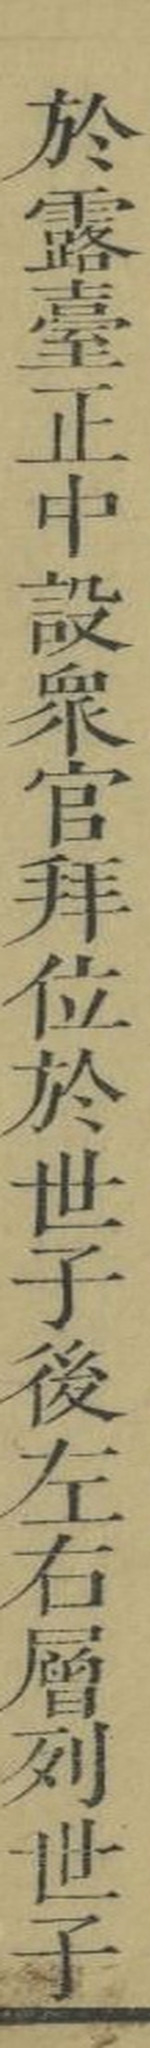於露臺正中設衆官拜位於世子後左右層列世子
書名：中山伝信録 巻二
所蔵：University of the Ryukyus Library
